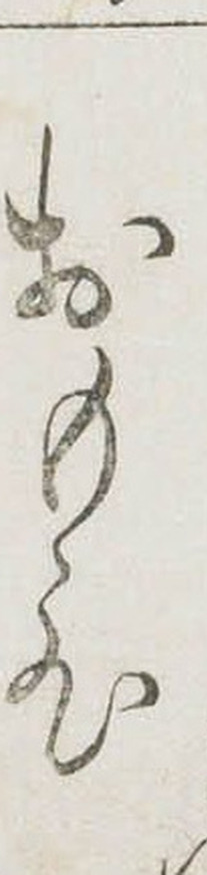おもひ
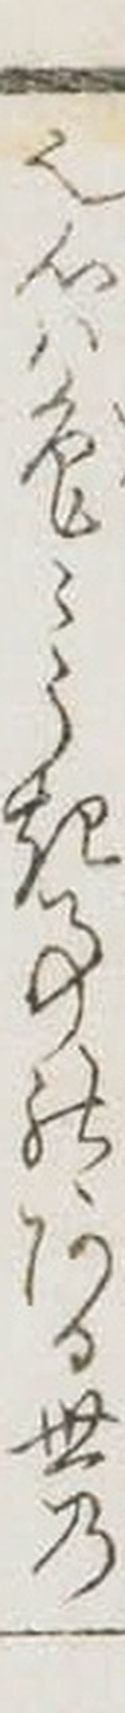也心は色々うき事のある世の
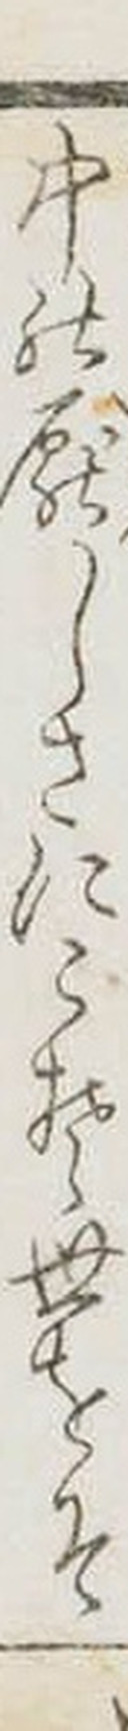中の厭しさにこそ世をそ
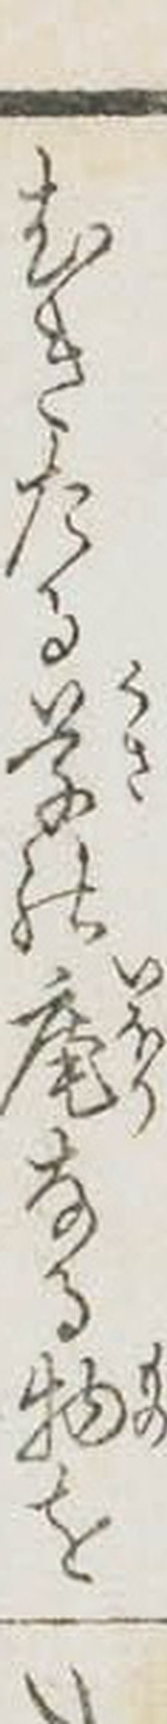むきたる草の庵なる物を
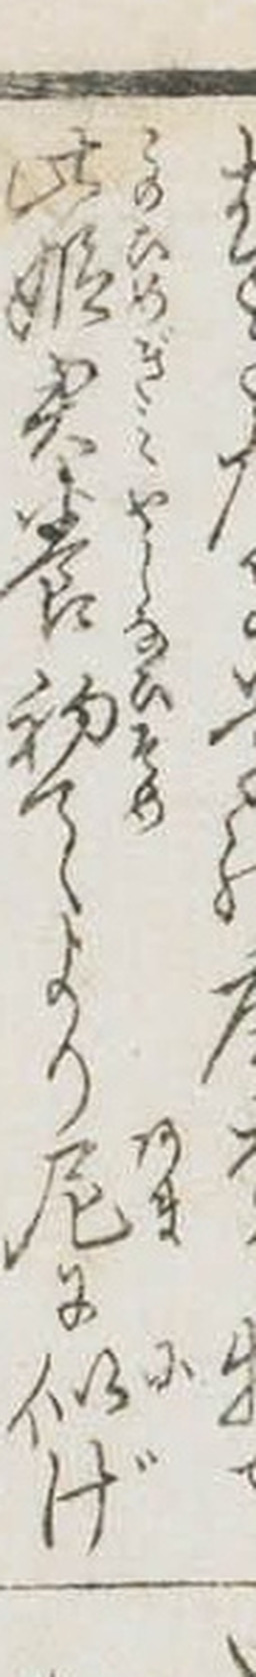此姫君養初てより尼に似げ
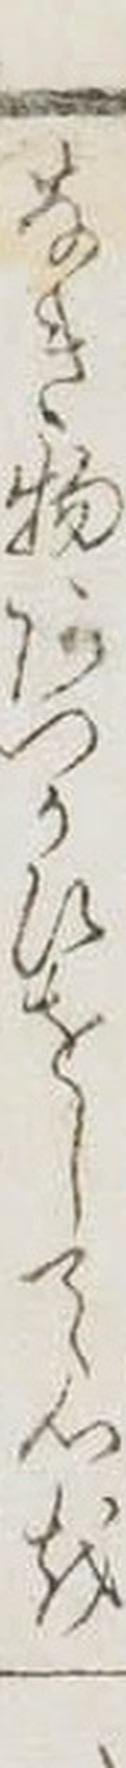なき物あつかひをして心を
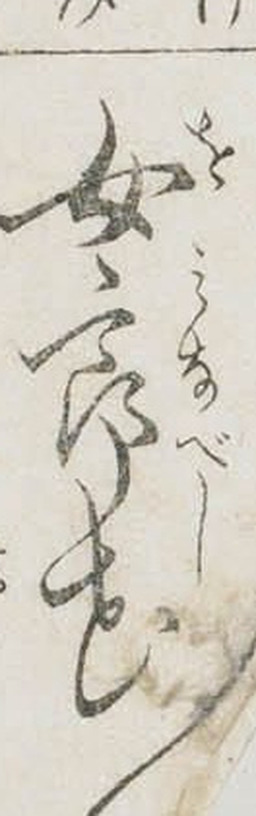女郎花
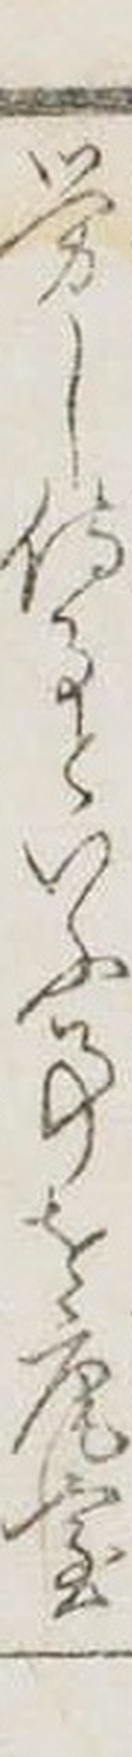労し侍るといふ事を庵室
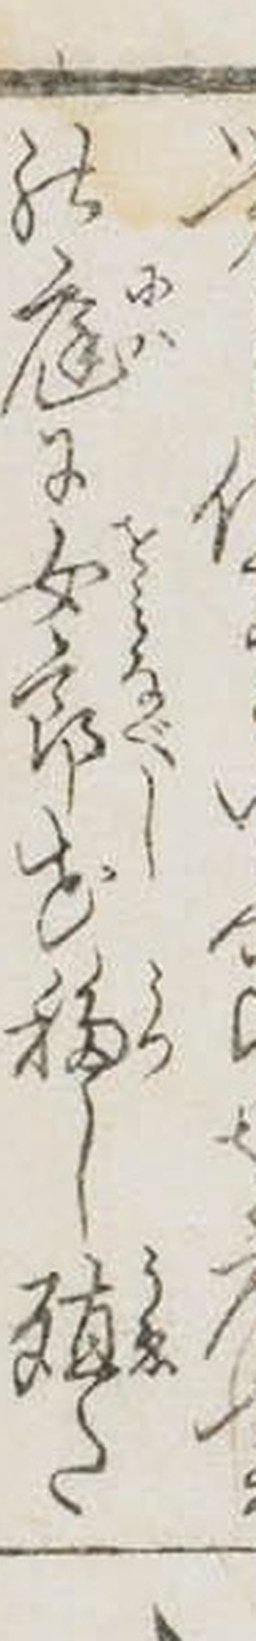の庭に女郎花移し植た
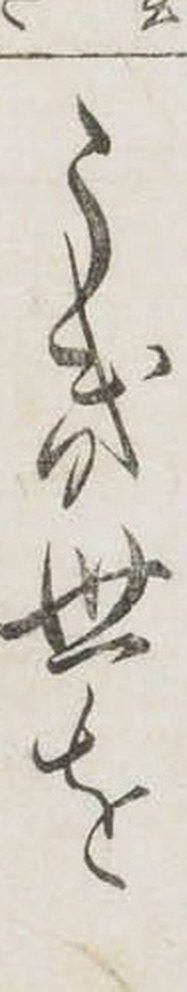うき世を
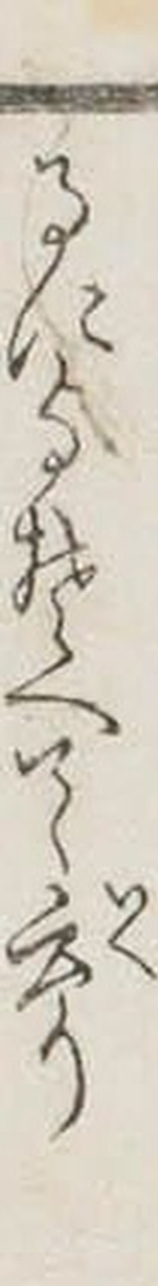るによそへて云り
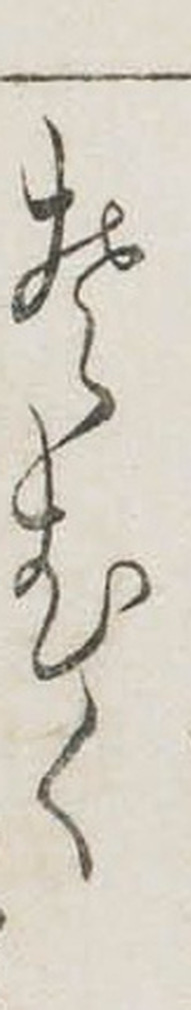そむく
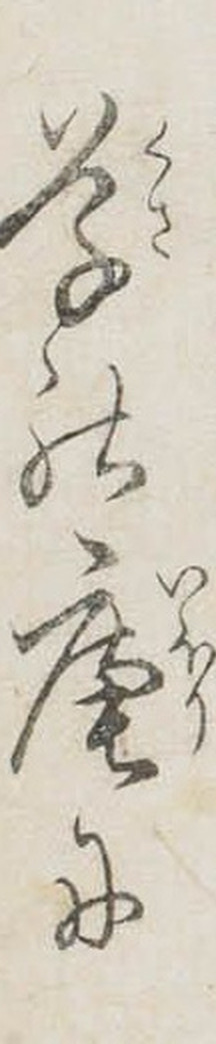草の庵に

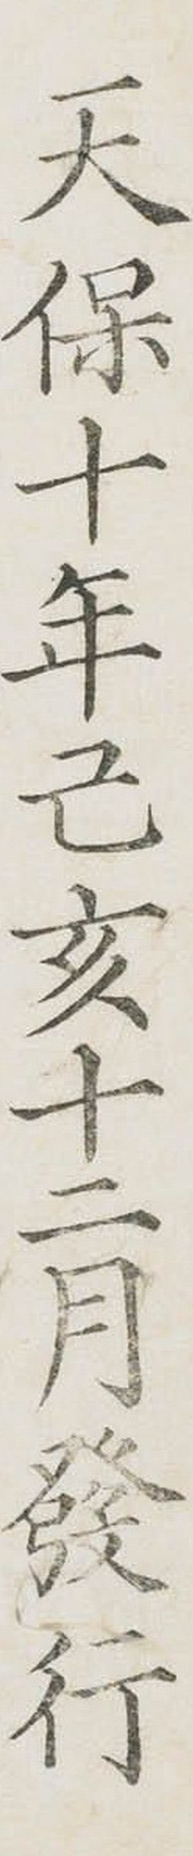天保十年己亥十二月発行
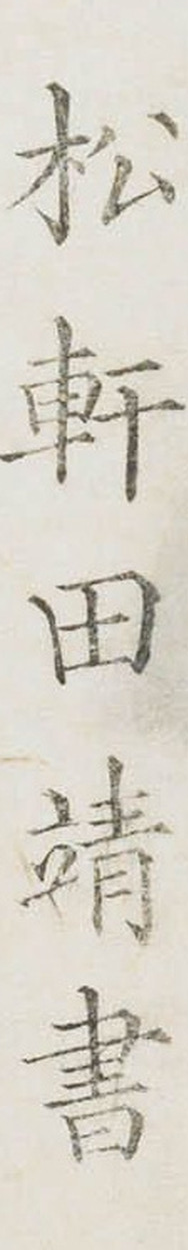松軒田靖書
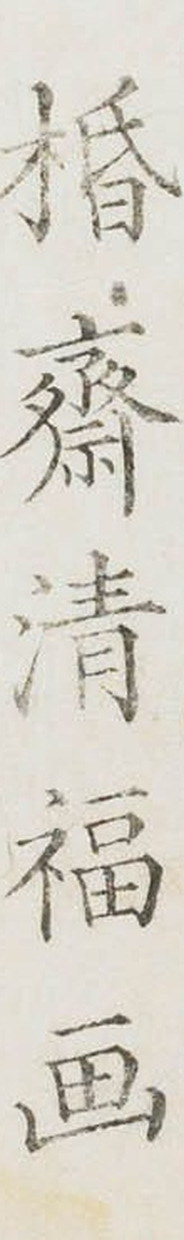棔斎清福画
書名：源氏百人一首
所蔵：東京学芸大学教育コンテンツアーカイブ
